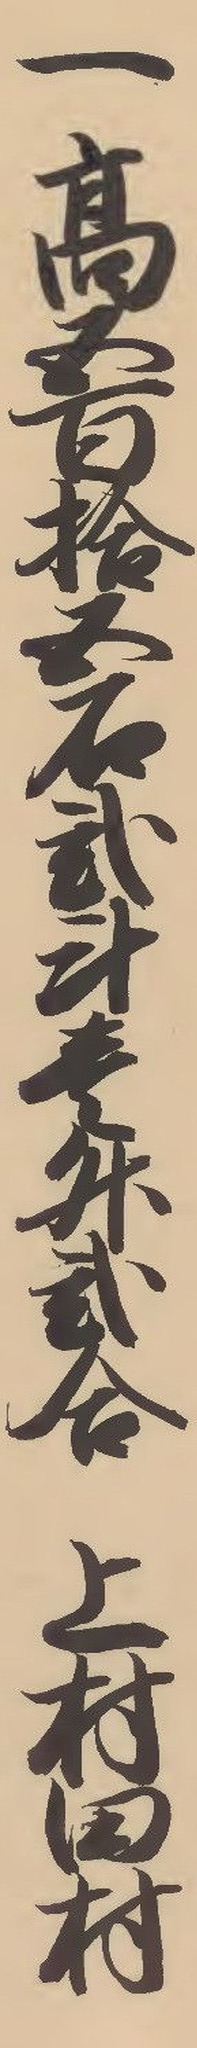一高五百拾五石弐斗壱升弐合上村田村
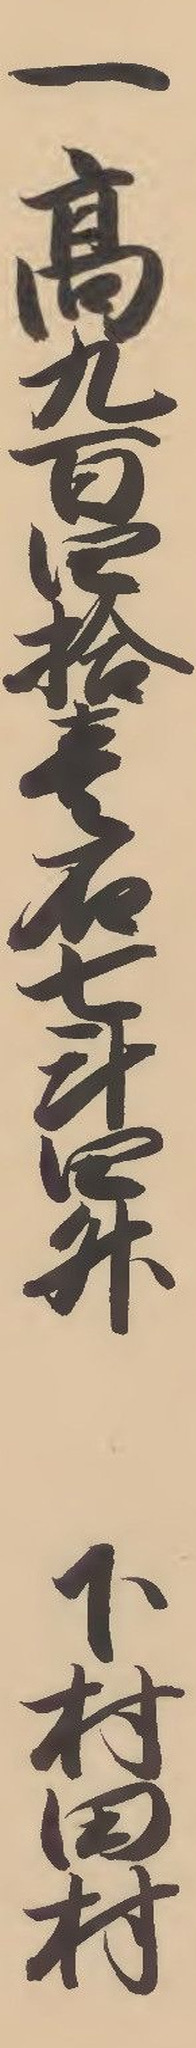一高九百四拾壱石七斗四升下村田村

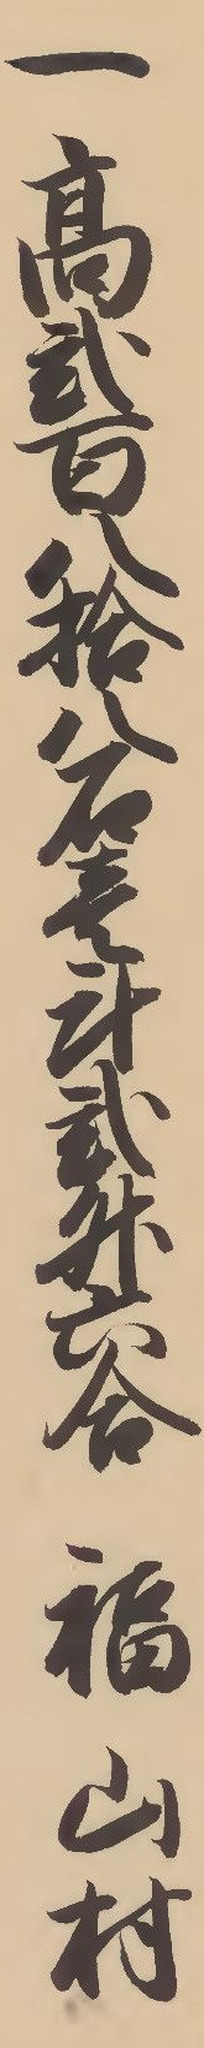一高弐百八拾八石壱斗弐升六合福山村
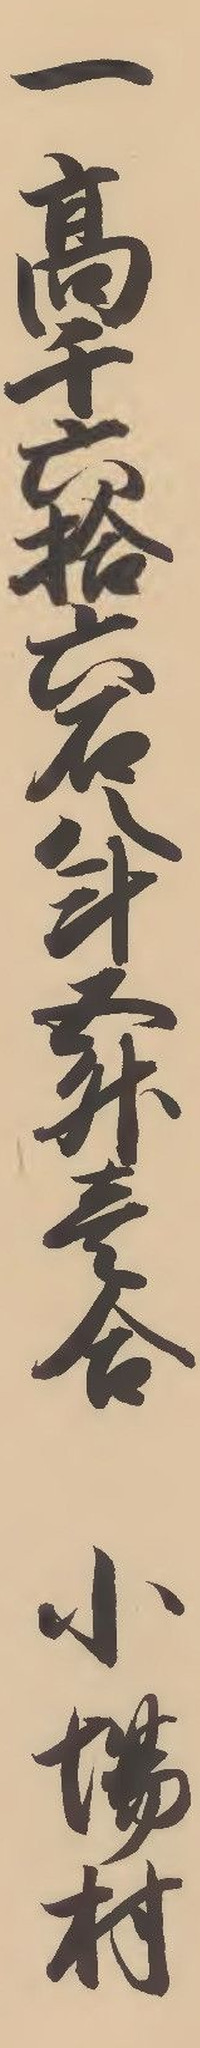一高千六拾六石八斗五外壱合小場村
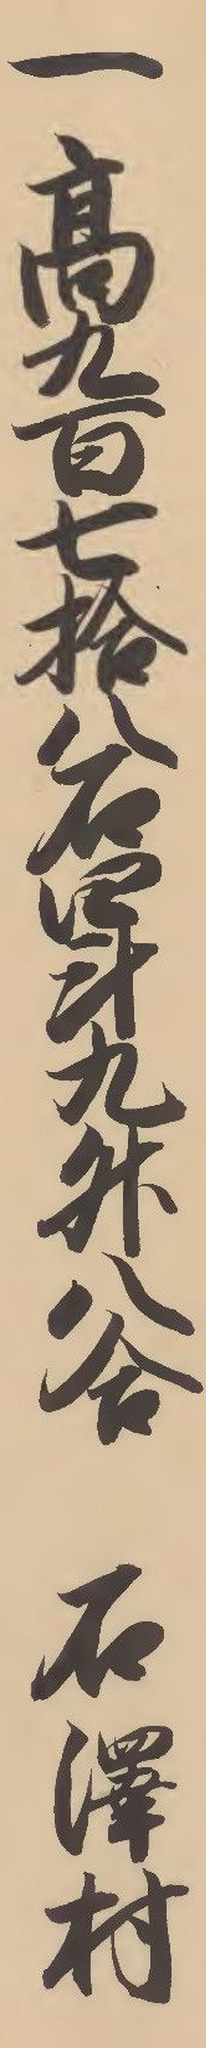一高九百七拾八石四斗九升八合石沢村
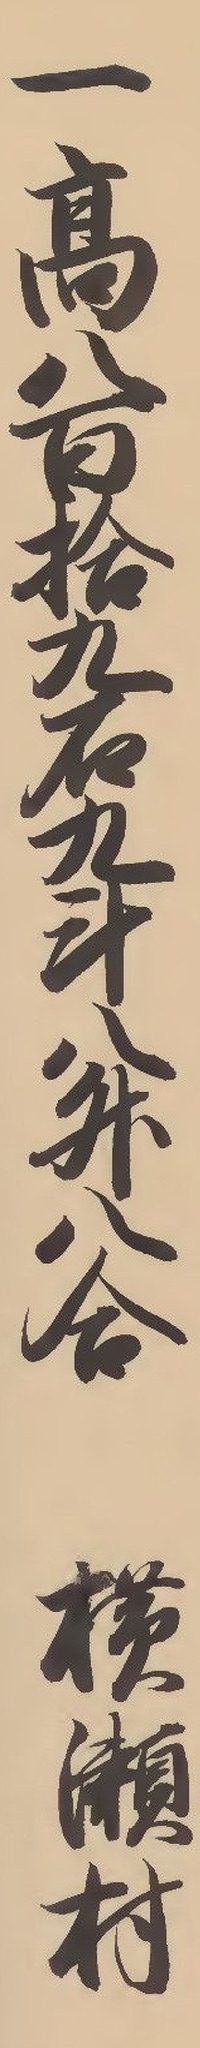一高八百拾九石九斗八升八合横瀬村
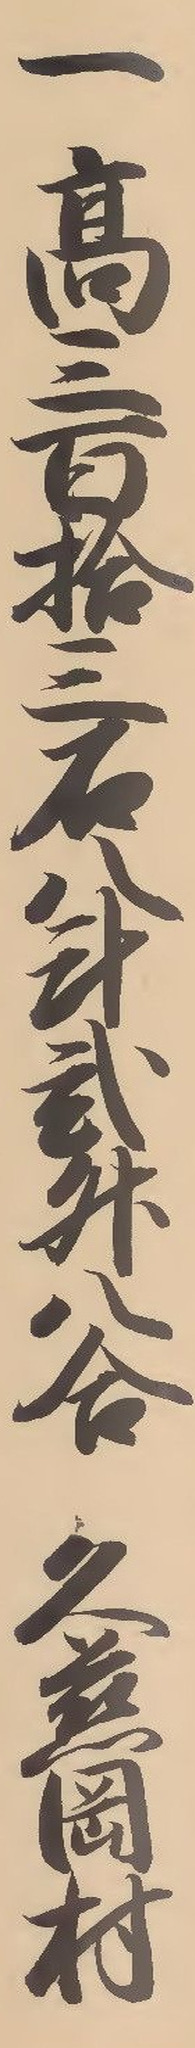一高三百拾三石八斗弐升八合久慈岡村
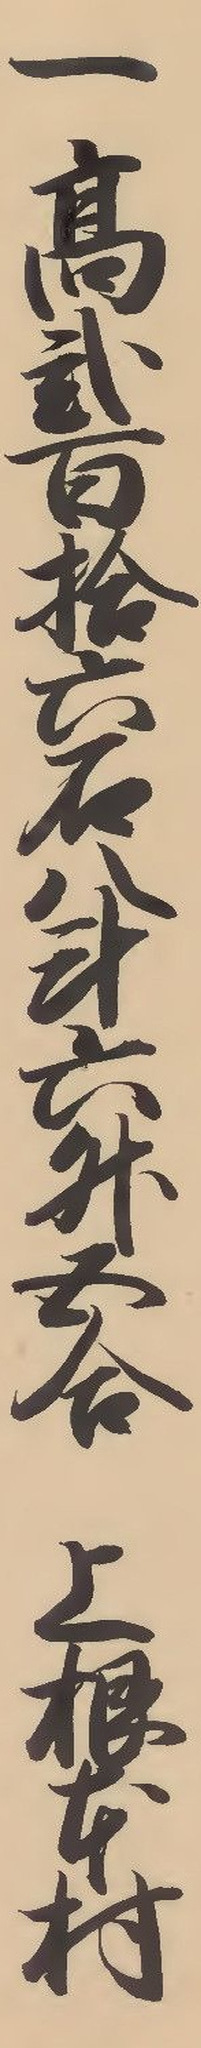一高弐百拾六石八斗六升五合上根本村
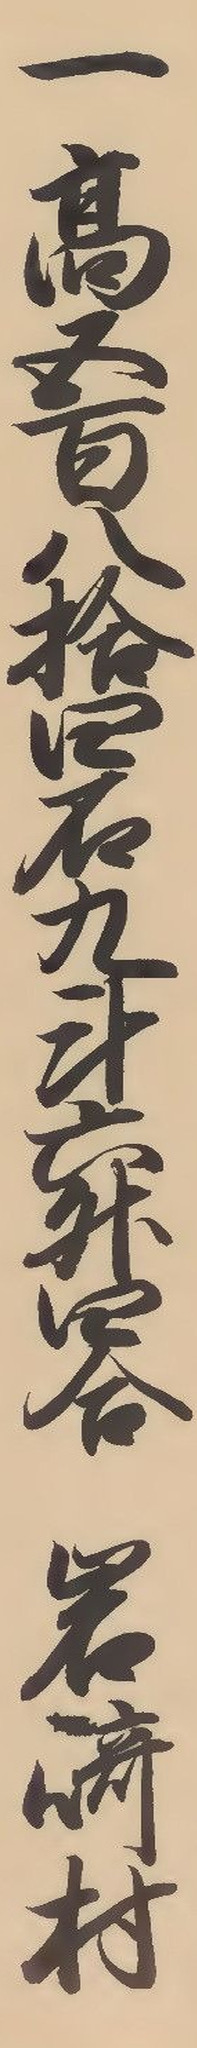一高五百八拾四石九斗六升四合岩崎村
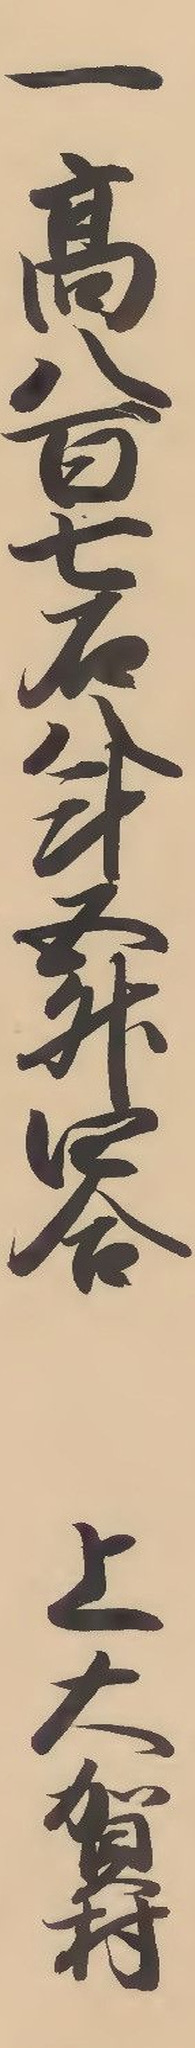一高八百七石八斗五升四合上大賀村

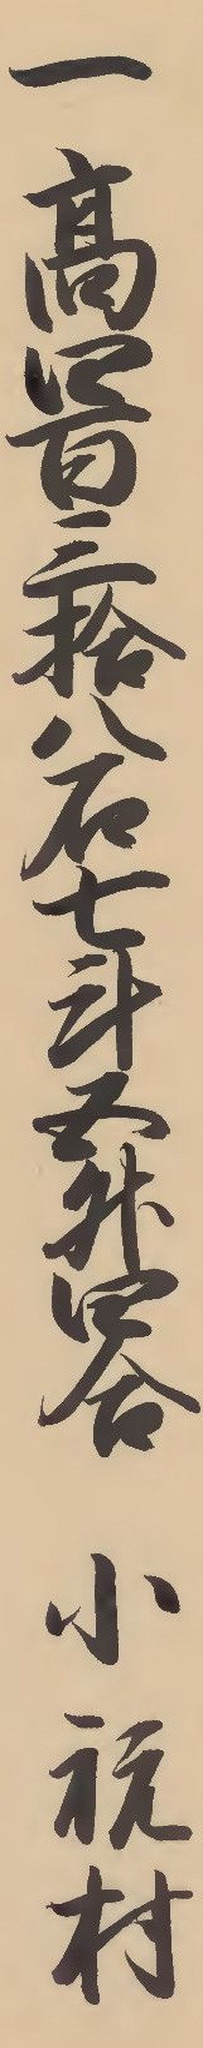一高四百三拾八石七斗五升四合小祝村
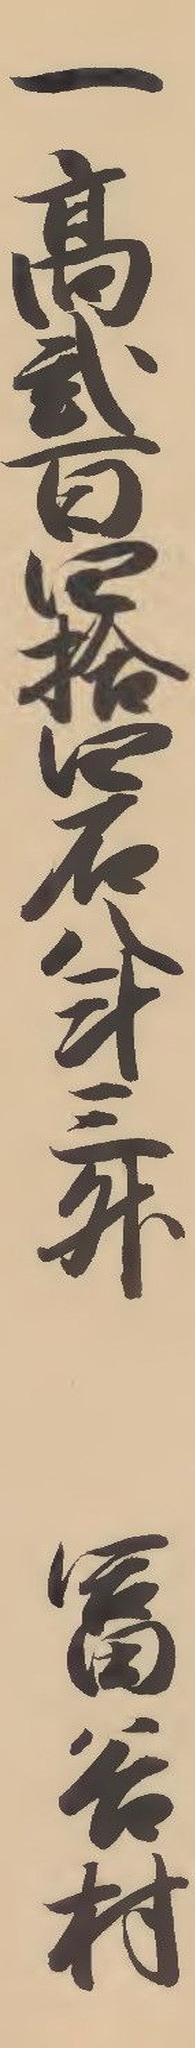一高弐百四拾四石八斗三升富谷村
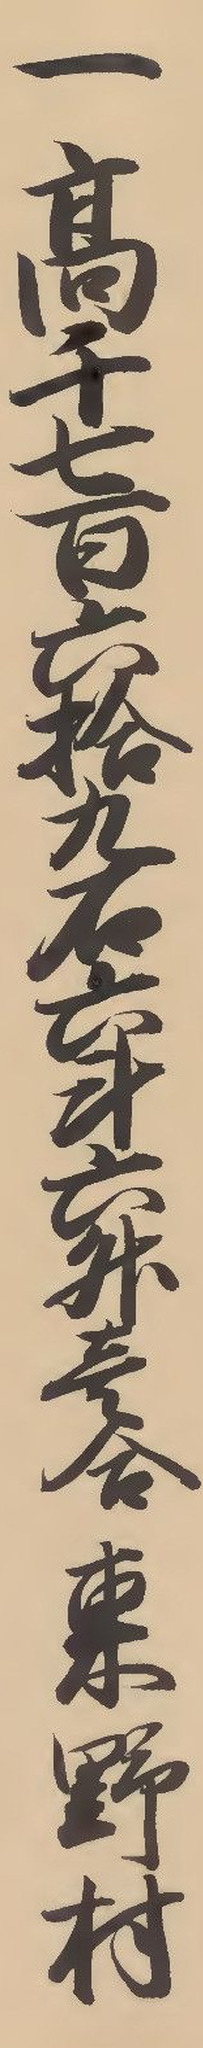一高千七百六拾九石六斗六升壱合東野村
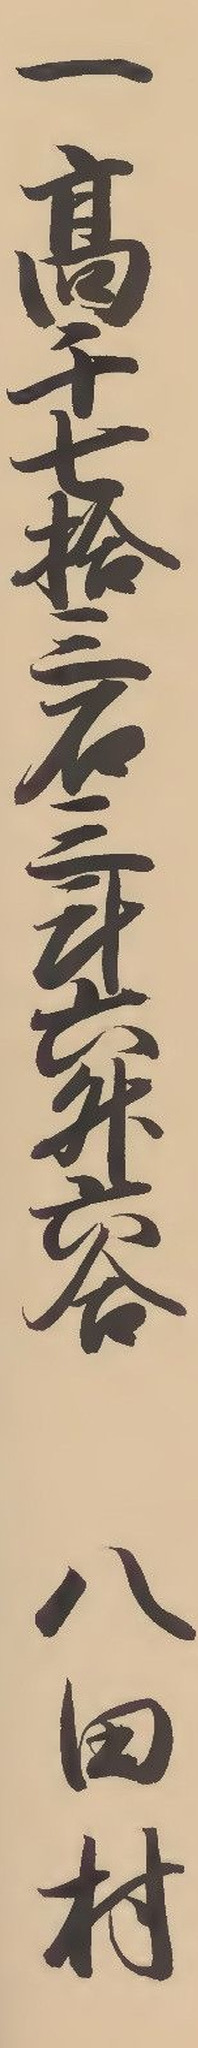一高千七拾三石三斗六升六合八田村
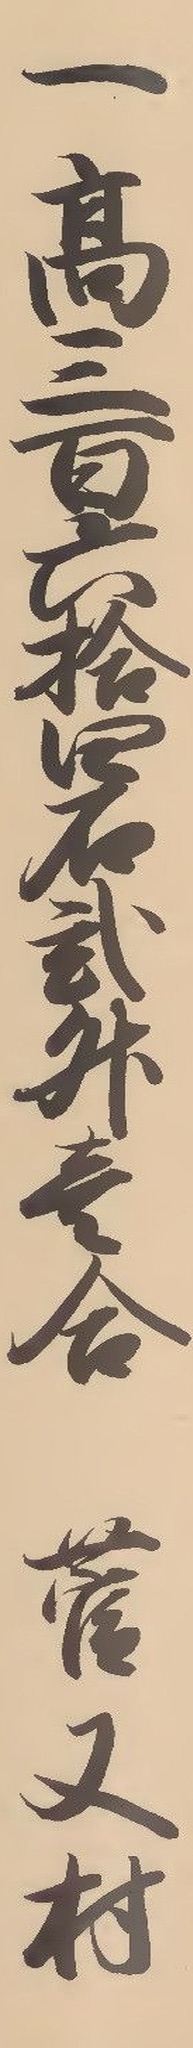一高三百六拾四石弐升壱合菅又村
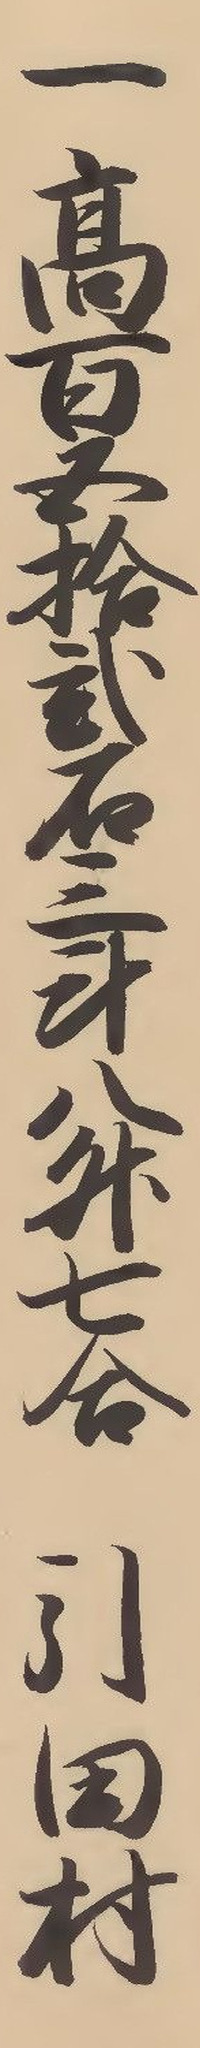一高百五拾弐石三斗八升七合引田村
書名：常陸国郷帳
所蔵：国立公文書館 National Archives of Japan
